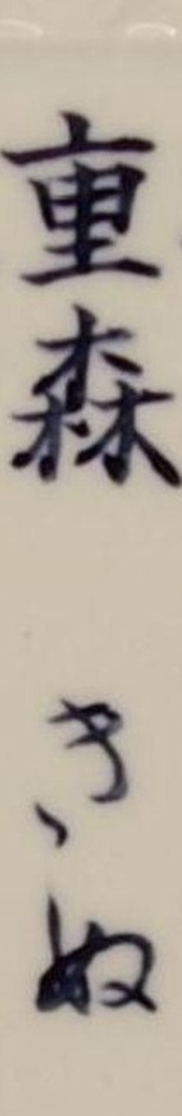重森きぬ
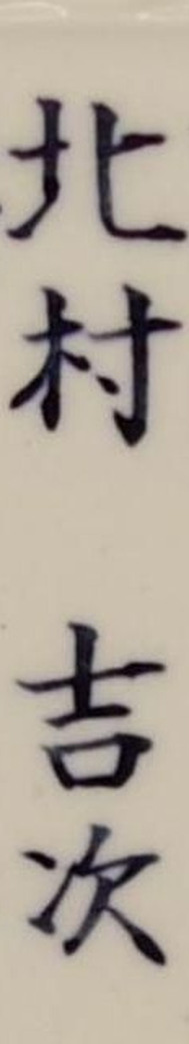北村吉次
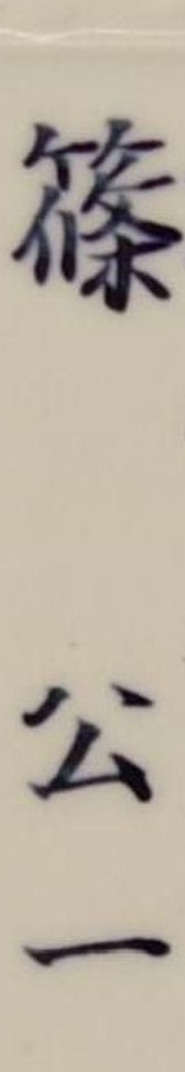篠公一
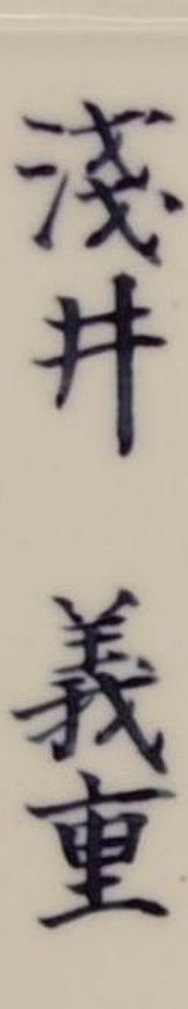浅井義重
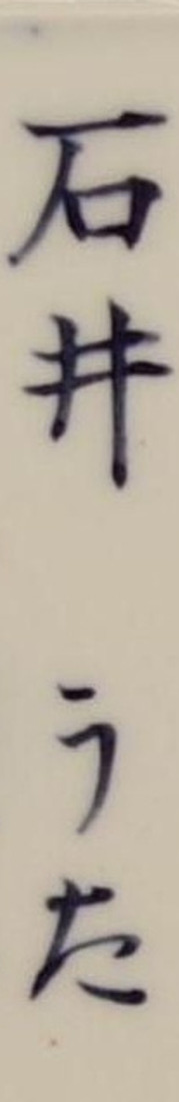石井うた
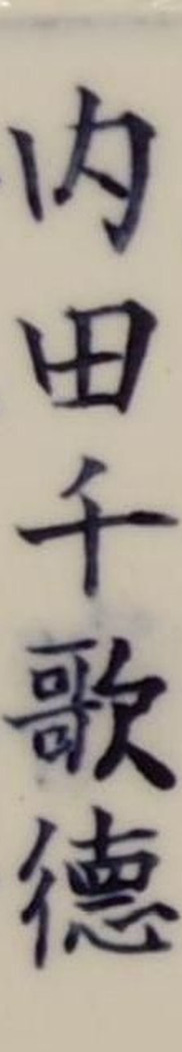内田千歌徳
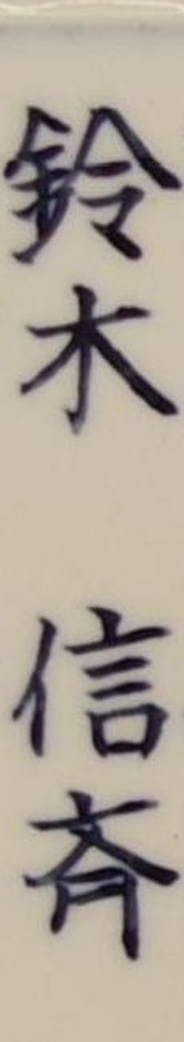鈴木信斎
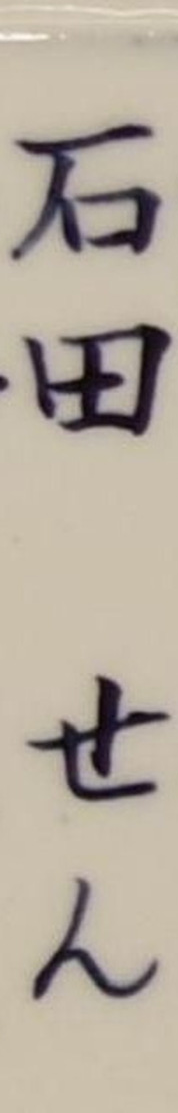石田せん
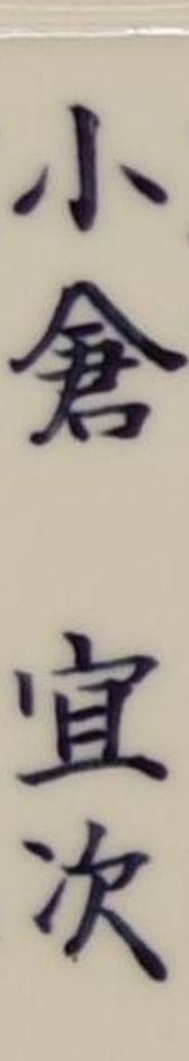小倉宜次
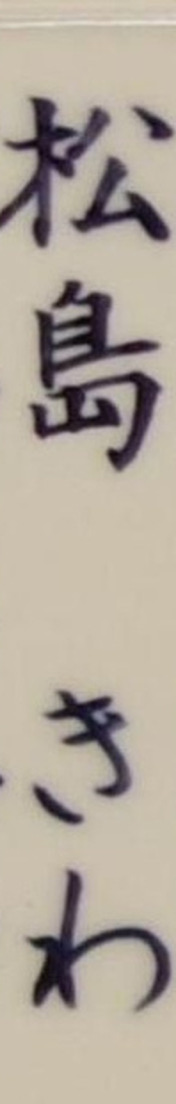松島きわ
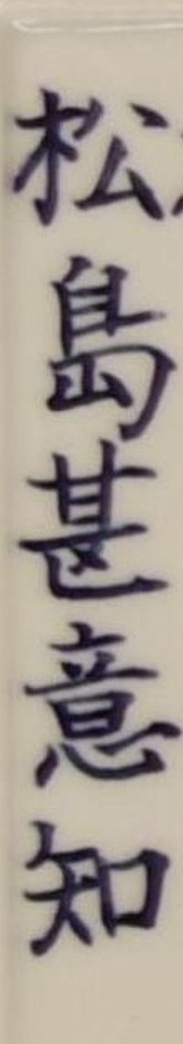松島甚意知

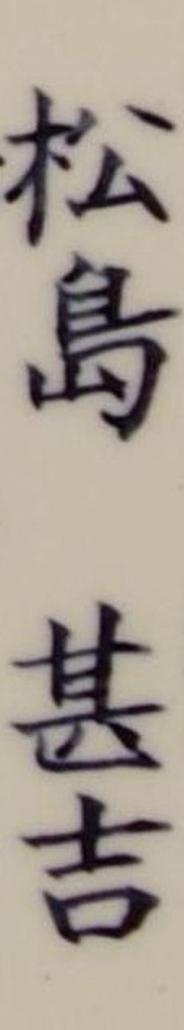松島甚吉
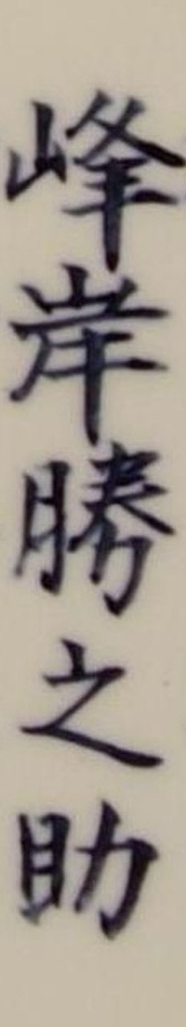峰岸勝之助
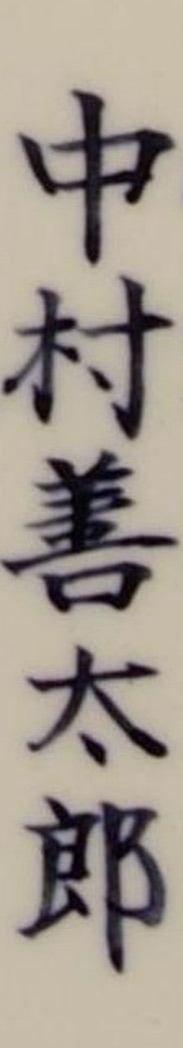中村善太郎
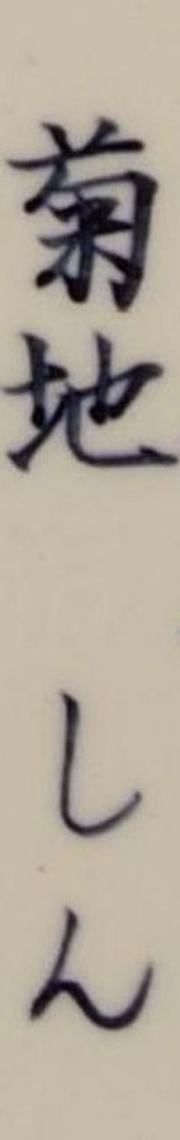菊地しん
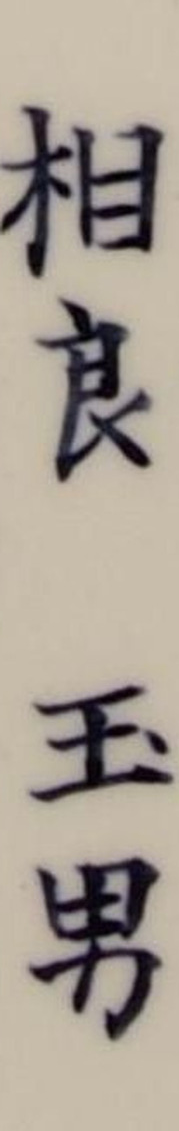相良玉男
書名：E~L
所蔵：高野山金剛峯寺
